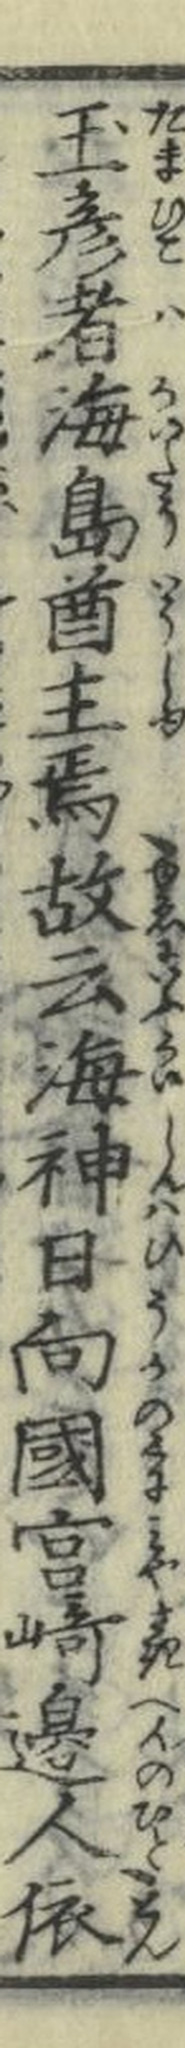玉彦者海島酋主焉、故云海神日向国宮崎辺人、依
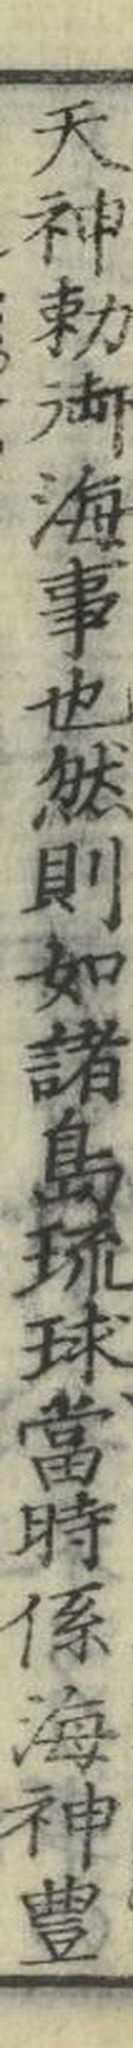天神勅御海事也、然則如諸島琉球、当時係海神豊
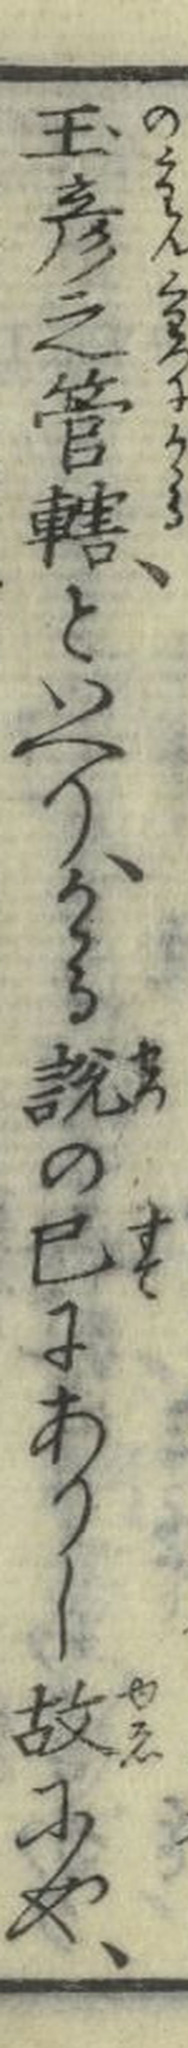玉彦之管轄、といへり、かゝる説の已にありし故にや、
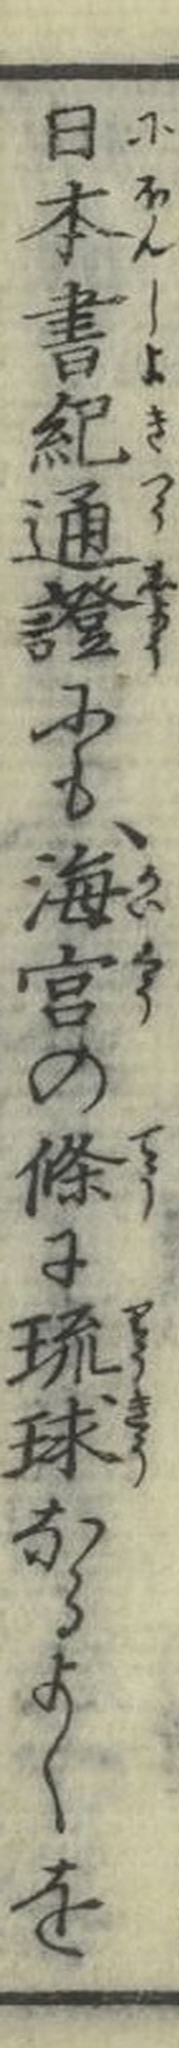日本書紀通証にも、海宮の条に琉球なるよしを
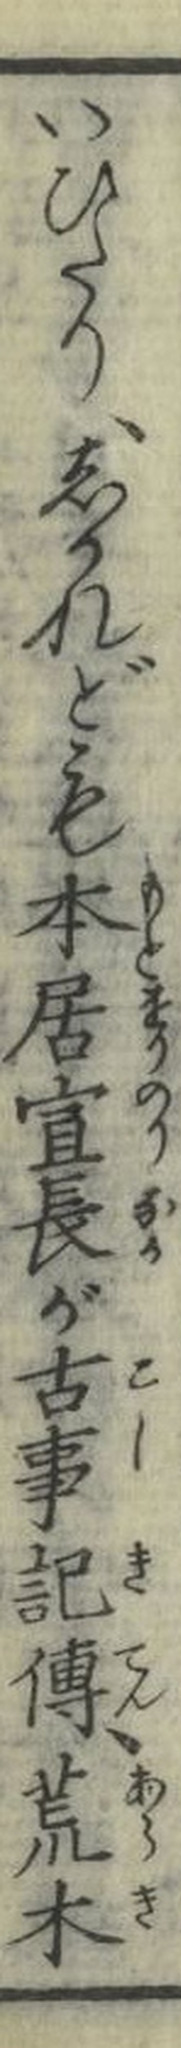いひたり、しかれども本居宣長が古事記伝、荒木

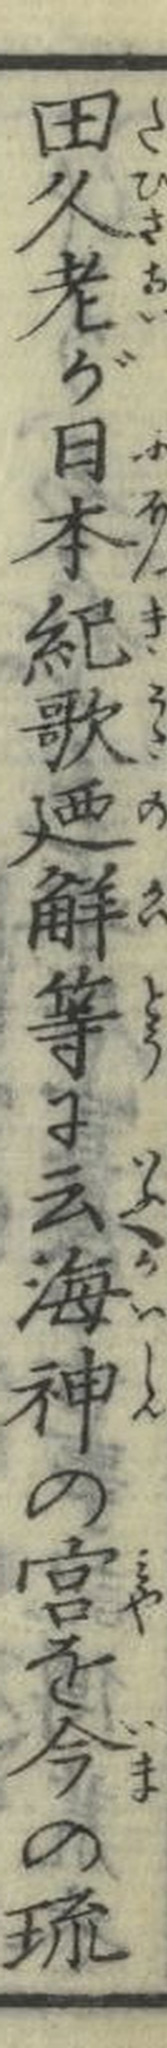田久老が日本紀歌廼解等に云、海神の宮を今の琉
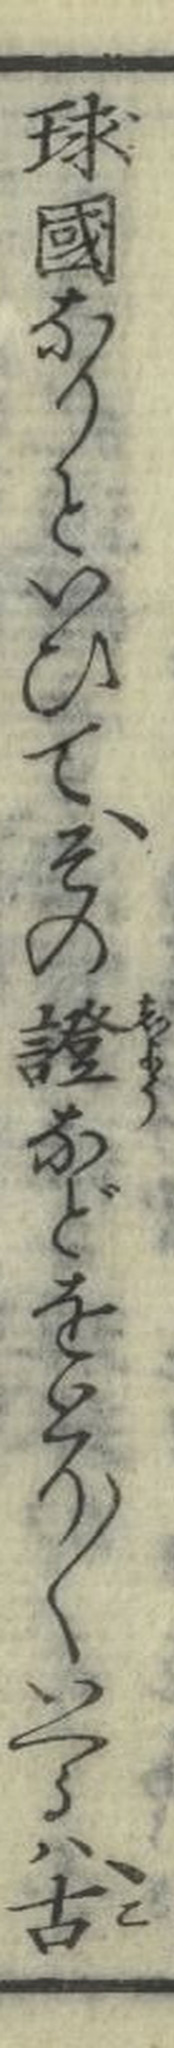球国なりといひて、その証などをとかくいへるは、古
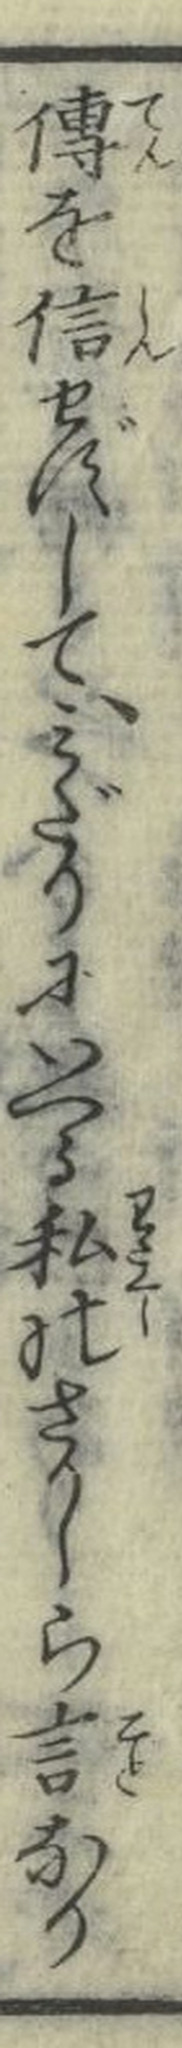伝を信せずして、みだりにいへる私のさかしら言なり
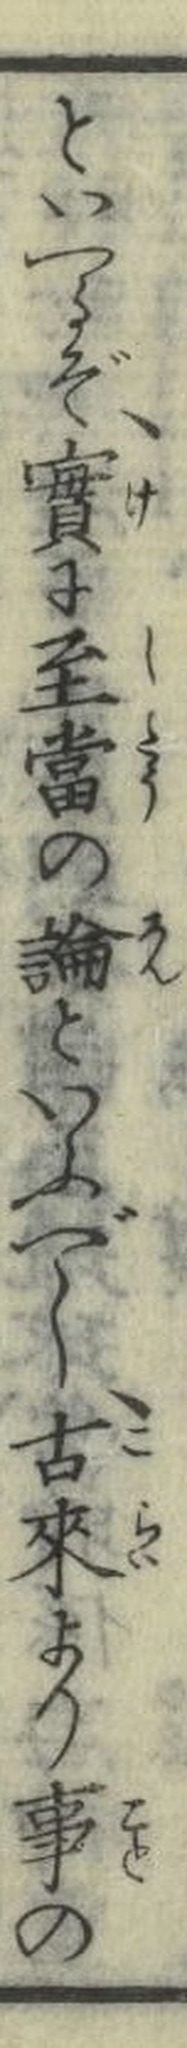といへるぞ、実に至当の論といふべし、古来より事の
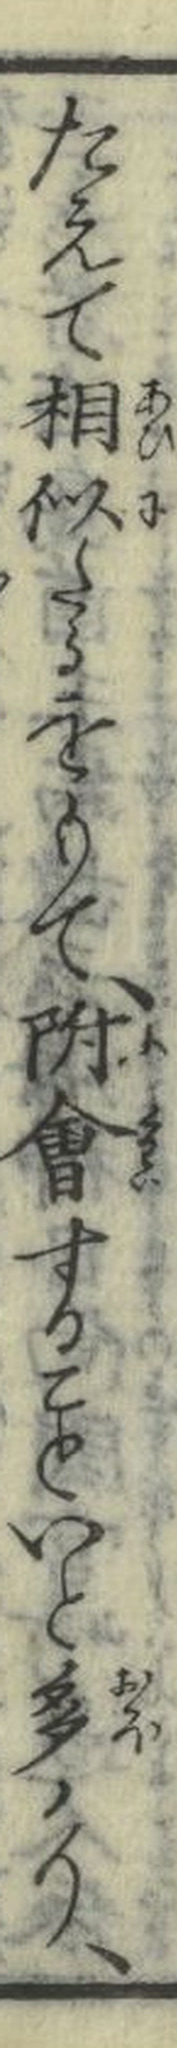たえて相似たるをもて、附会することいと多かり、
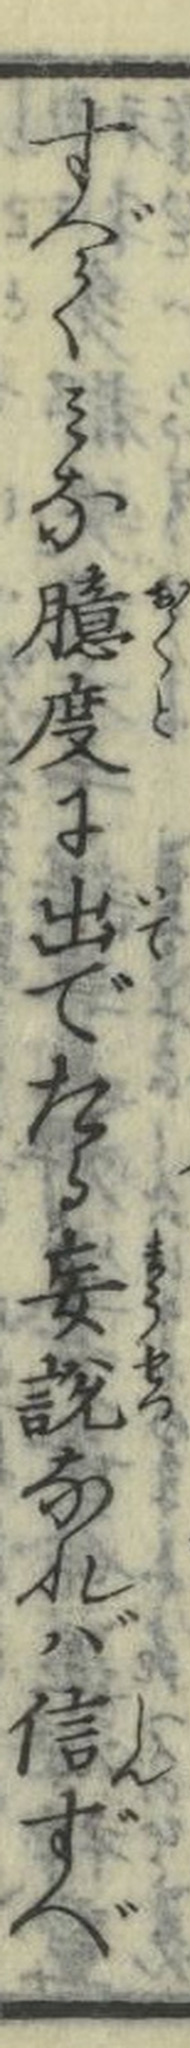すべてみな臆度に出でたる妄説なれば信ずべ
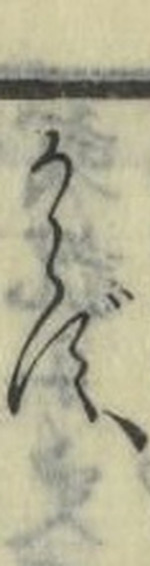からず、
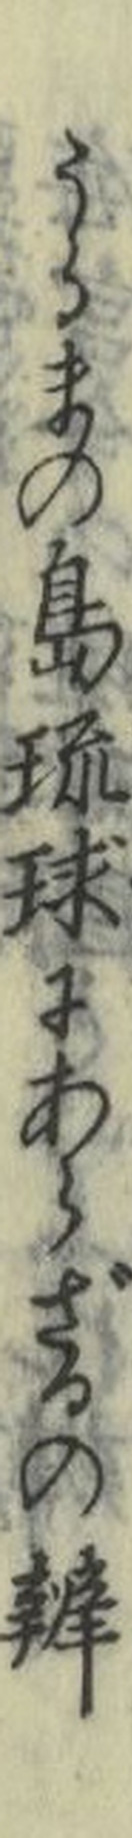うるまの島琉球にあらざるの弁
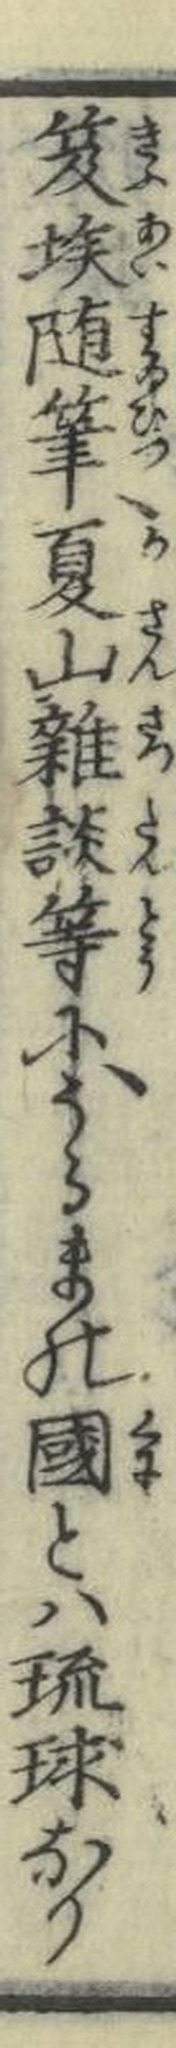笈埃随筆、夏山雑談等に、うるまの国とは琉球なり
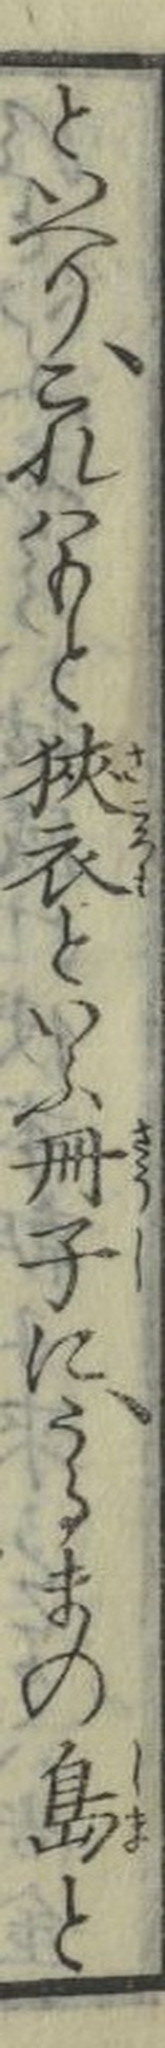といへり、これはもと狭衣といふ冊子に、うるまの島と
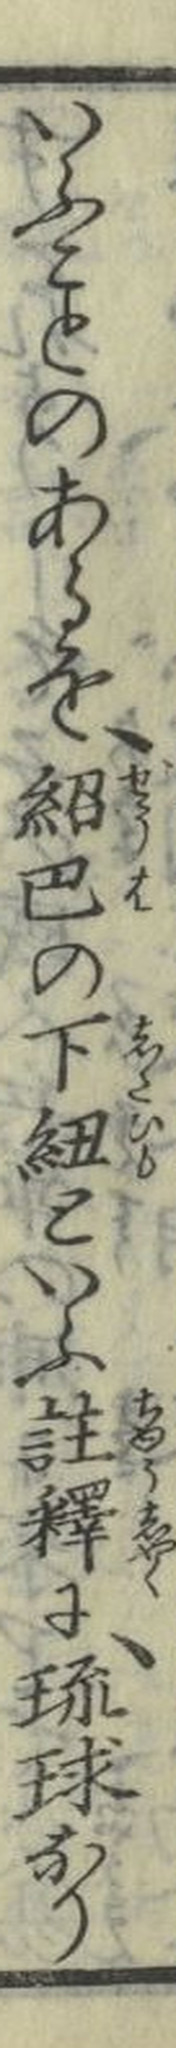いふことのあるを、紹巴の下紐といふ注釈に、琉球なり
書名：琉球入貢紀畧
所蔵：University of the Ryukyus Library
